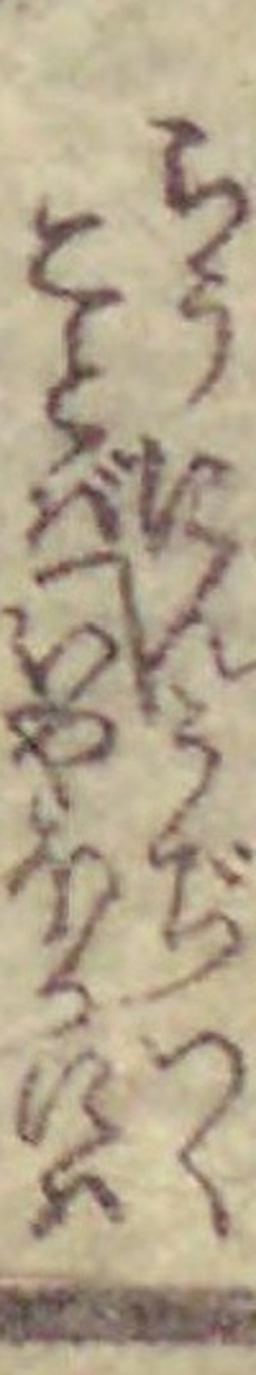ことば〽いやほかには
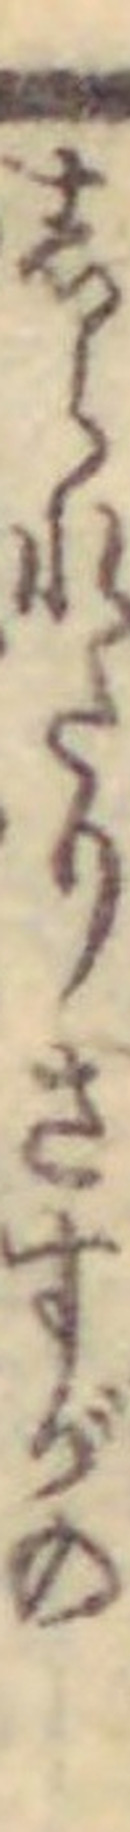しられたりさすがの
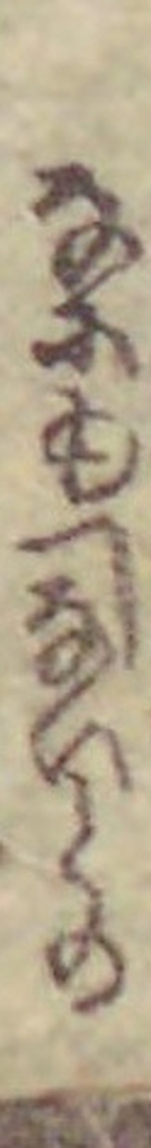なにも〽ないとの
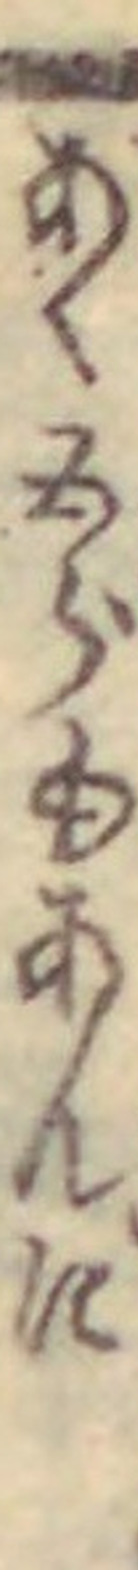あく五郎もあんに
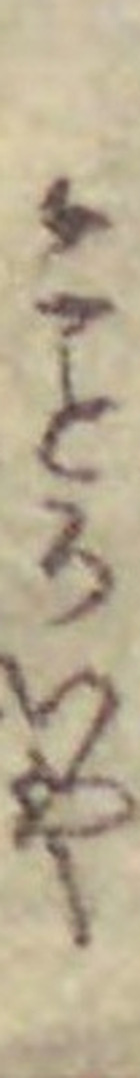ことかいや
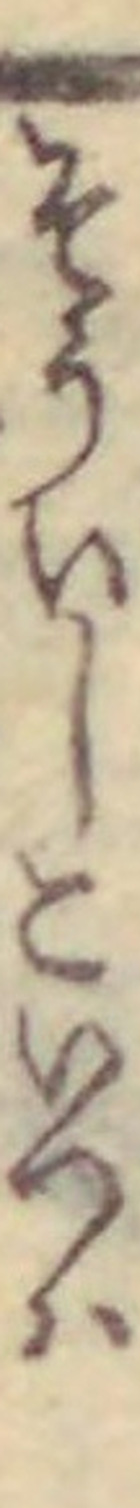そういしこいつは
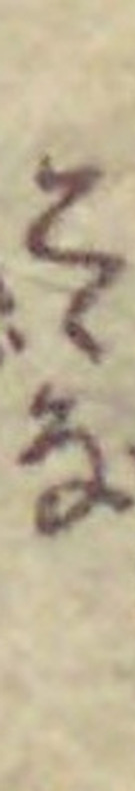こくな
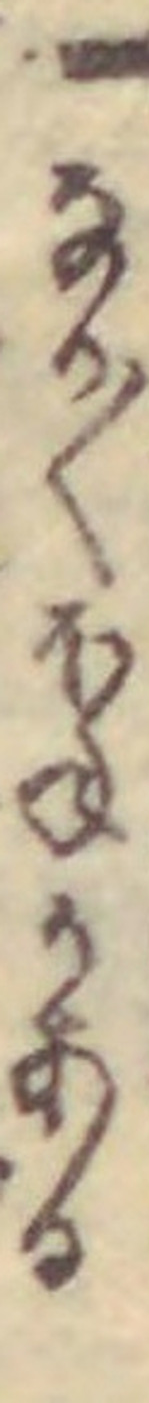なか〳〵ほねかある
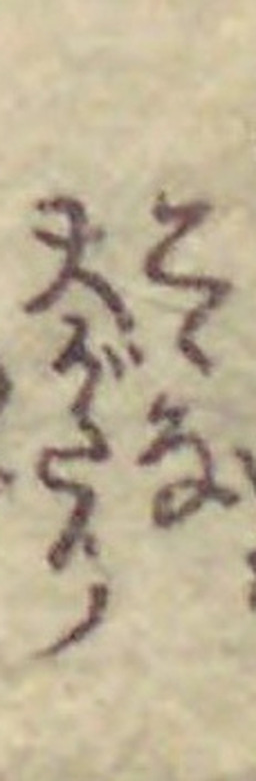大がたり
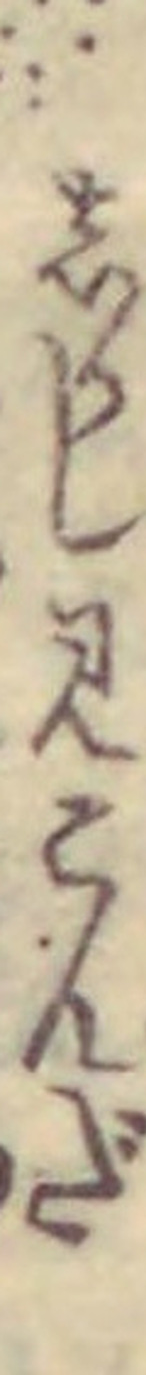しかし見こんだ
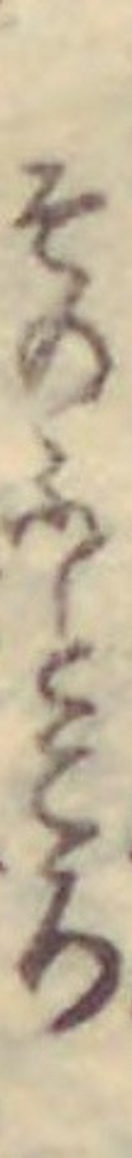そのふところ
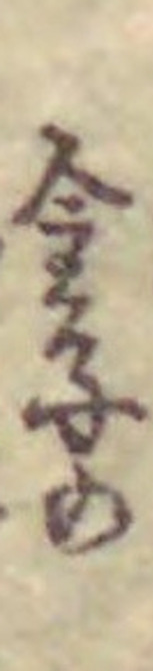金子の
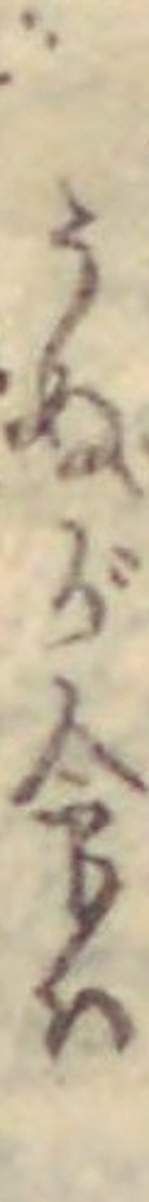うぬが命は
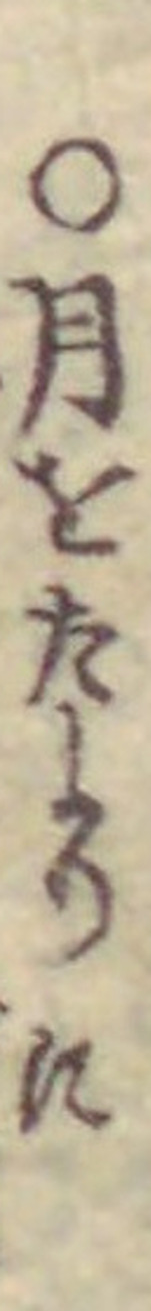○月をたよりにぬ
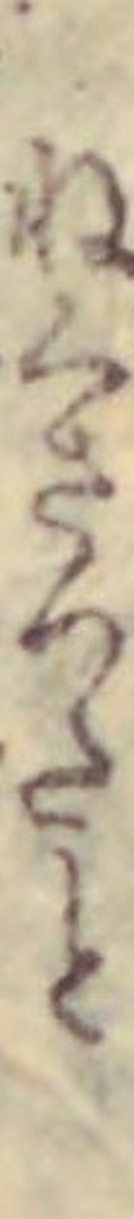ねくさつたと
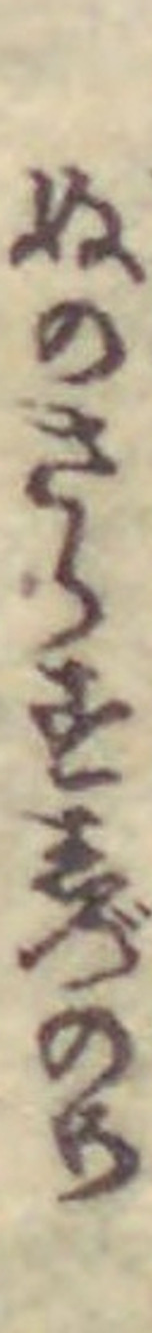のさらすしづのめ
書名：八ツ目鱣因縁物語 3巻
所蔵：国立国会図書館 National Diet Library, JAPAN
